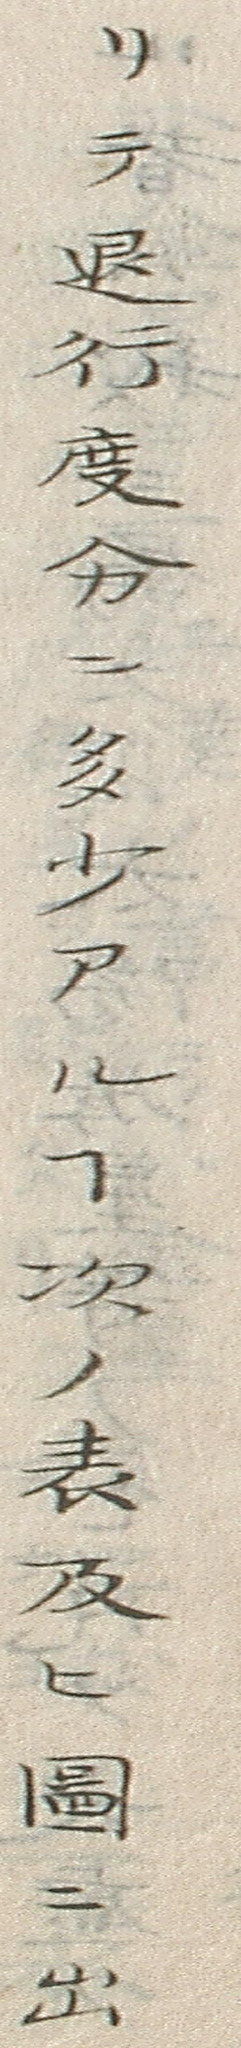リテ退行度分ニ多少アルコト次ノ表及ヒ図ニ出
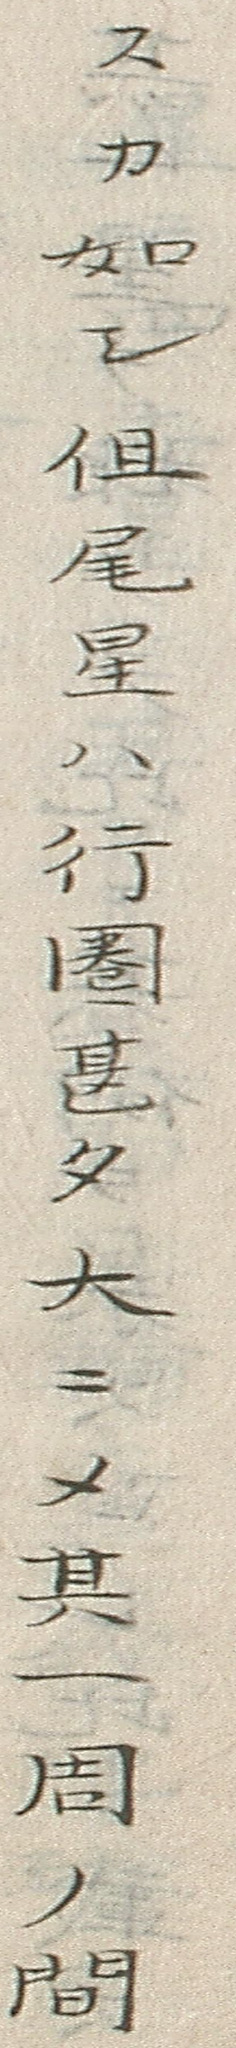スカ如シ但尾星ハ行圏甚大ニシテ其一周ノ間
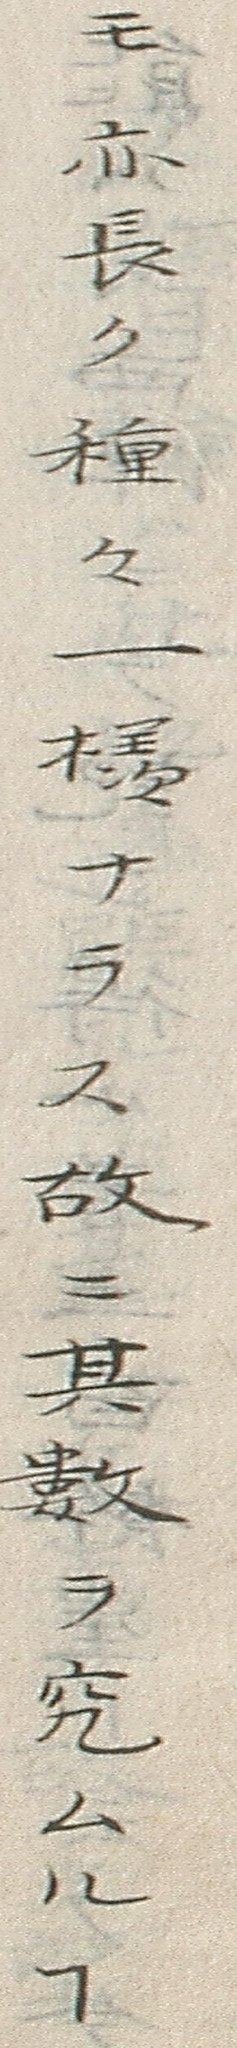モ亦長ク種々一様ナラス故ニ其数ヲ究ムルコト

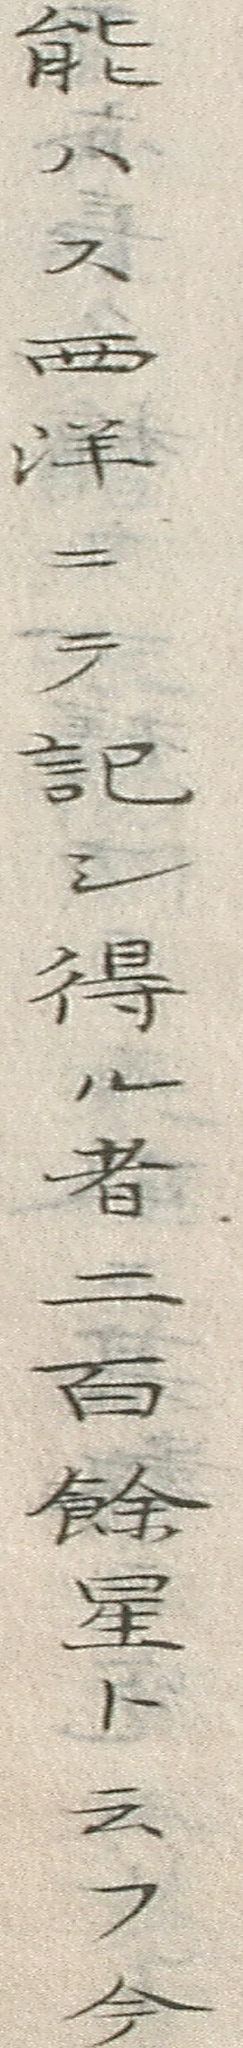能ハス西洋ニテ記シ得ル者ニ百余里ト云フ今
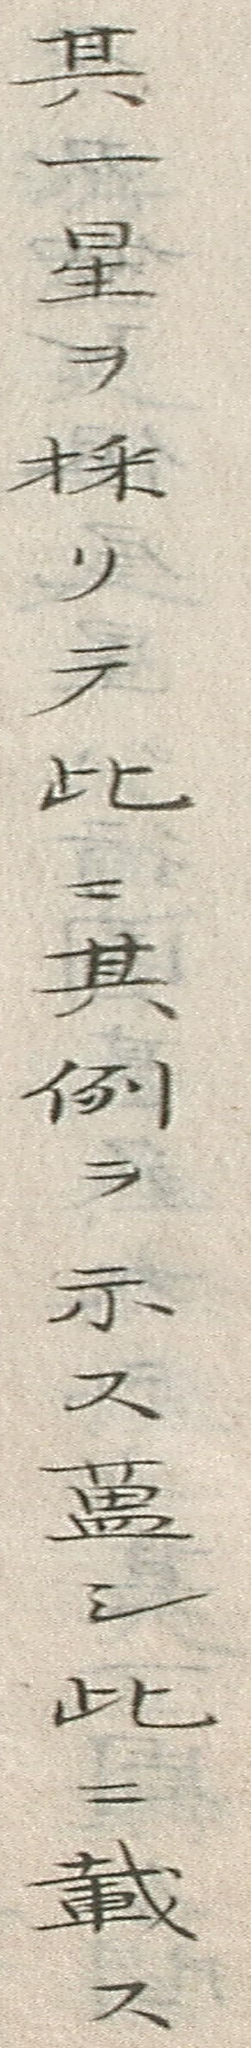其一星ヲ採リテ此ニ其例ヲス蒕シ此ニ載ス
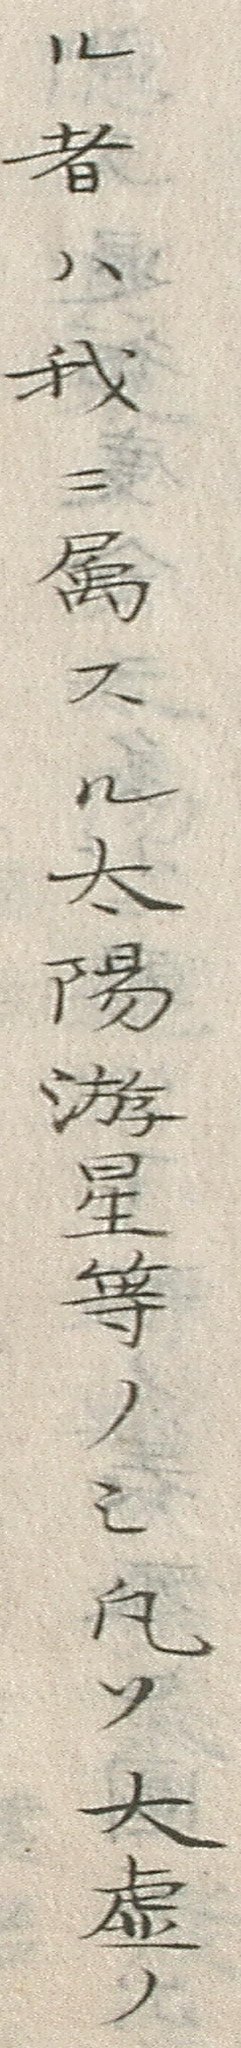ル者ハ我ニ属スル太陽游星等ノミ凡ソ大虚ノ
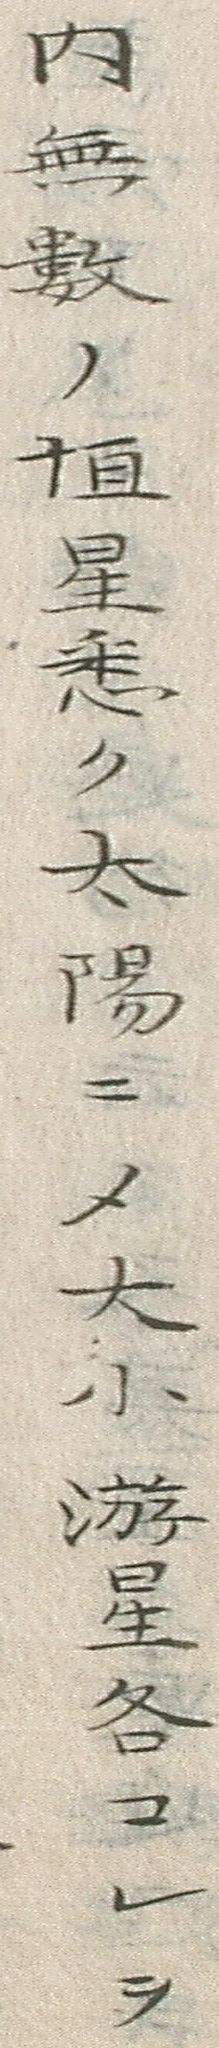内無数ノ恒星悉ク太陽ニシテ大小游星各コレヲ
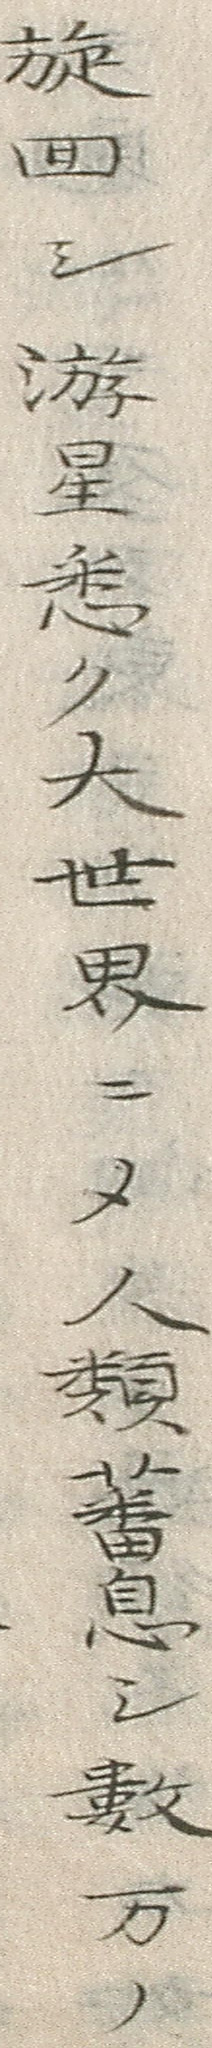旋回シ游星悉ク大世界ニシテ人類蕃息シ数万ノ
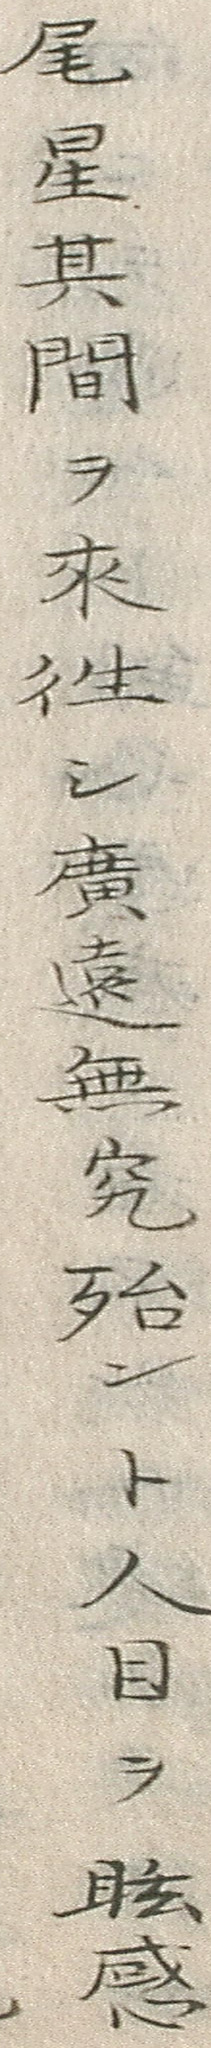尾星其間ヲ来往シ広遠無究殆ント人目ヲ眩惑
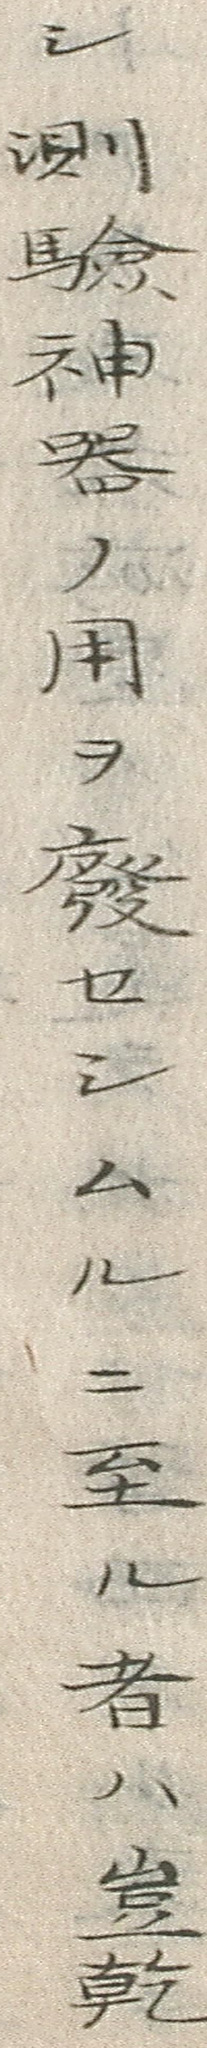シ測験神器ノ用ヲ廃セシムルニ至ル者ハ豈乾
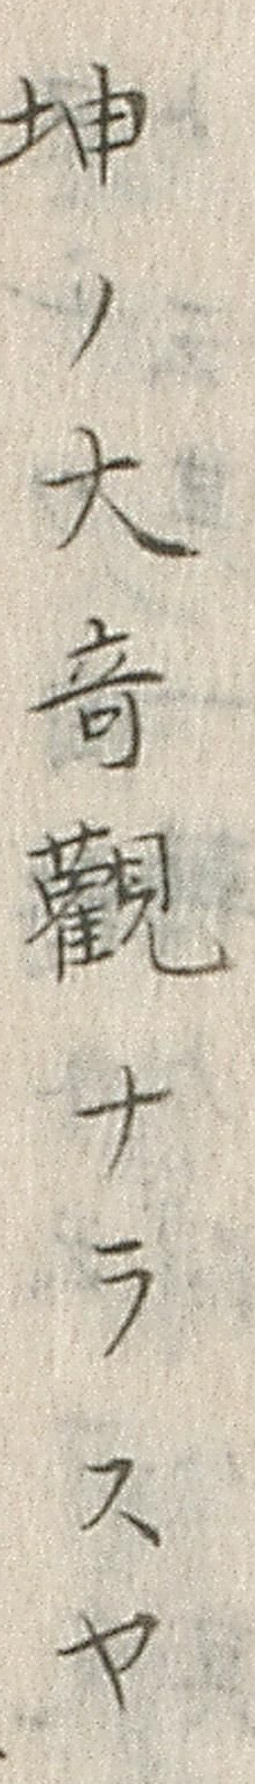坤ノ大奇観ナラスヤ
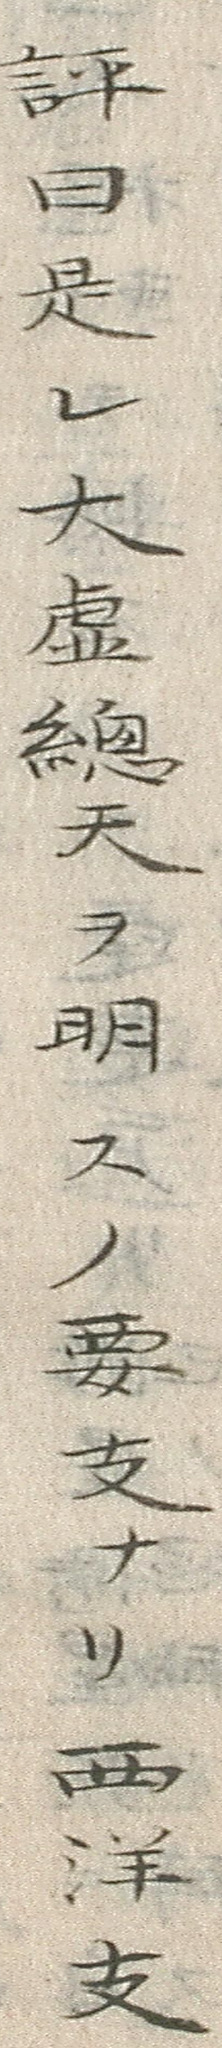評曰是レ大虚総天ヲ明スノ要支ナリ西洋支
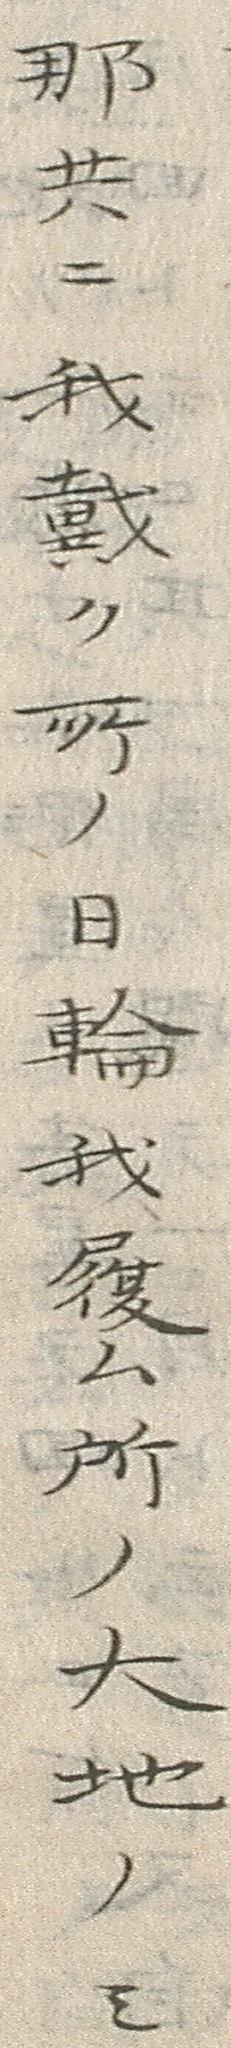那共ニ我戴ク所ノ日輪我履ム所ノ大地ノミ
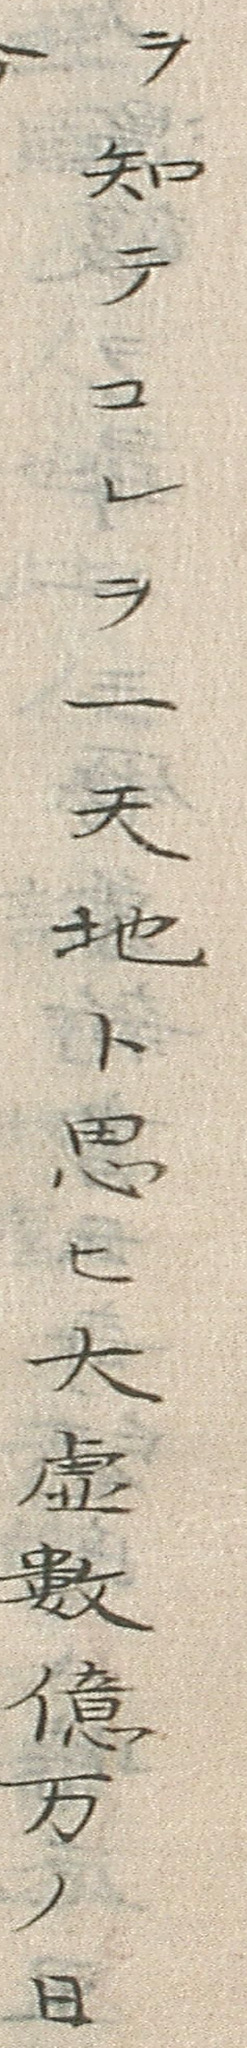ヲ知テコレヲ一天地ト思ヒ大虚数億万ノ日
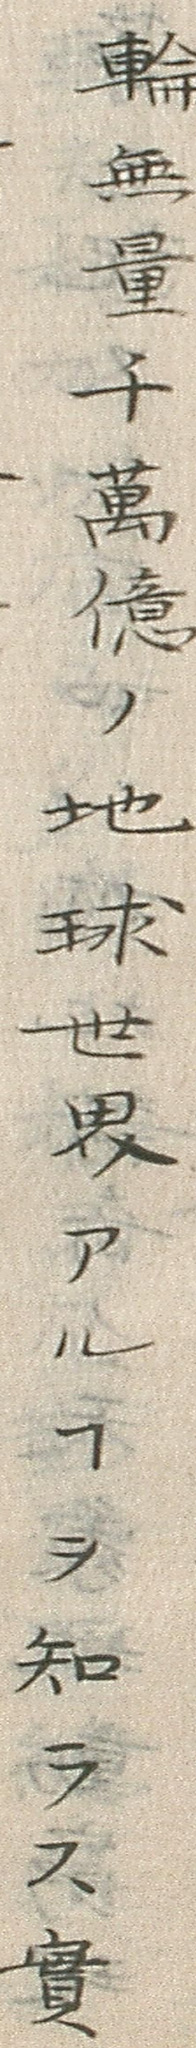輪無量千万億ノ地球世界アルコトヲ知ラス実
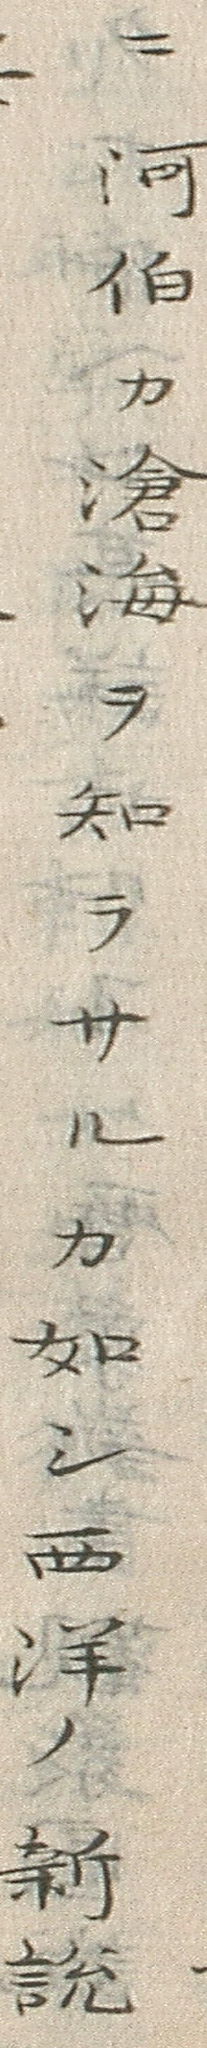ニ河伯カ滄海ヲ知ラサルカ如シ西洋ノ新説
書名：天學略名目羽翼　全
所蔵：東京大学地震研究所図書室 Earthquake Research Institute Library, The University of Tokyo, JAPAN
